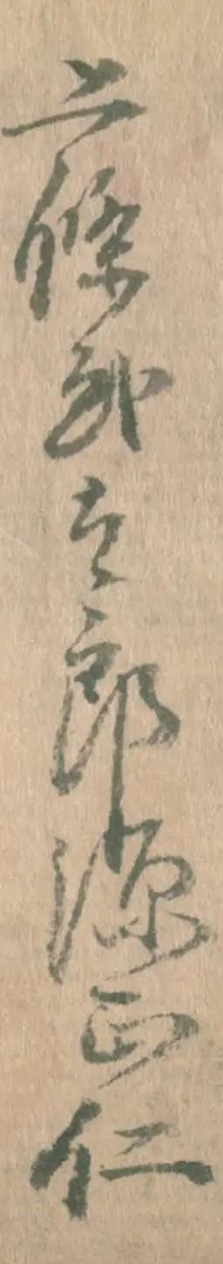上條武太郎源正仁
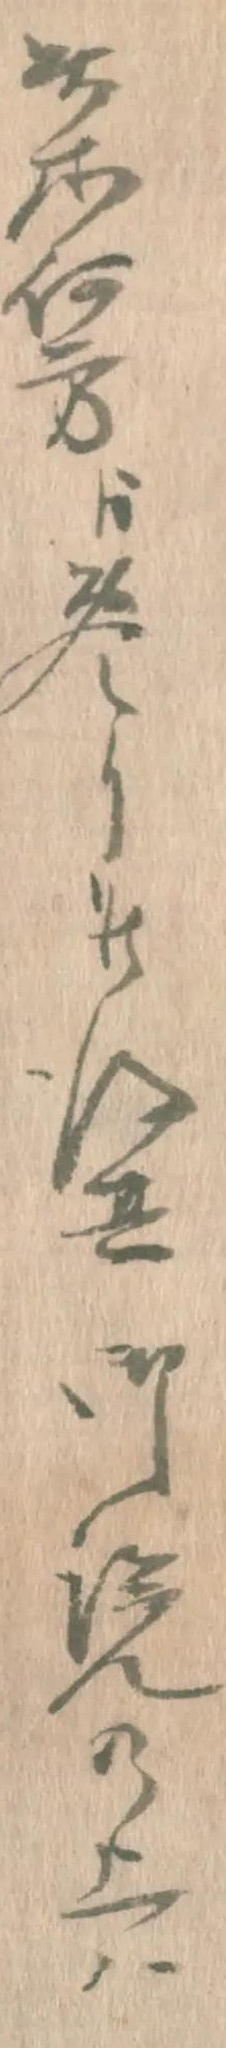此本何方より参り候得共御覧の上は
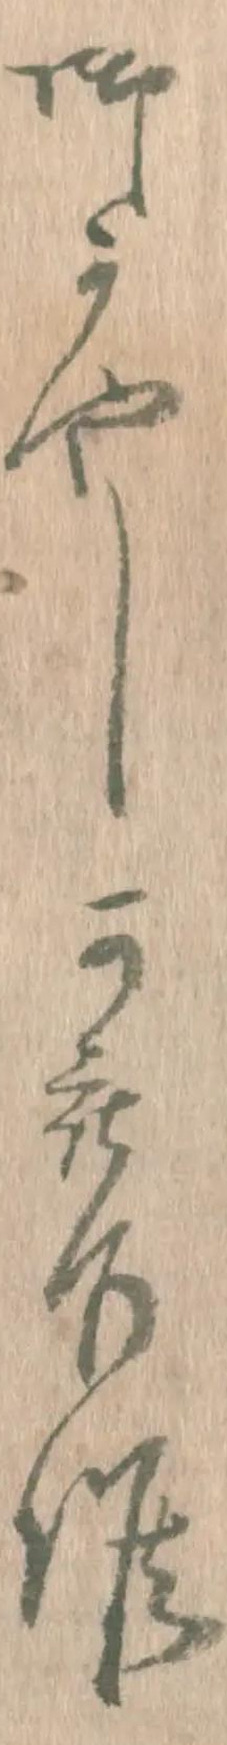御かやし可被下候
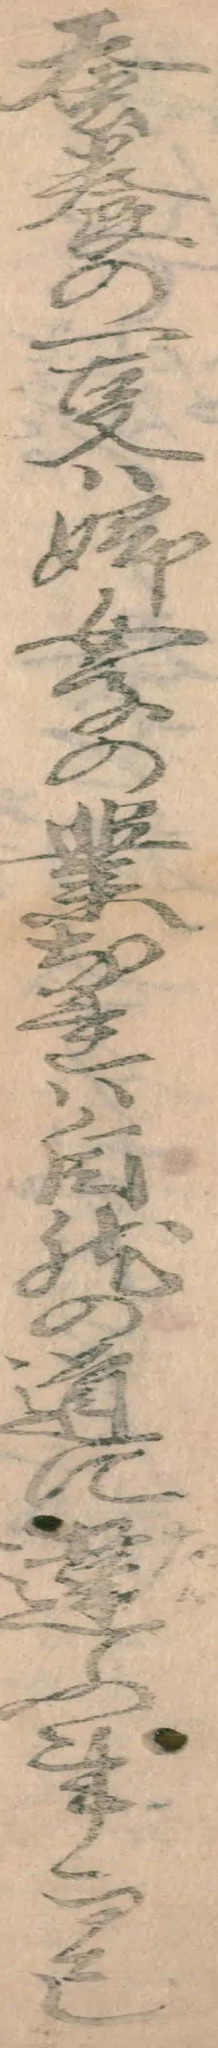蚕養の一事は婦女子の業なれは自然の道に違ふ事而已
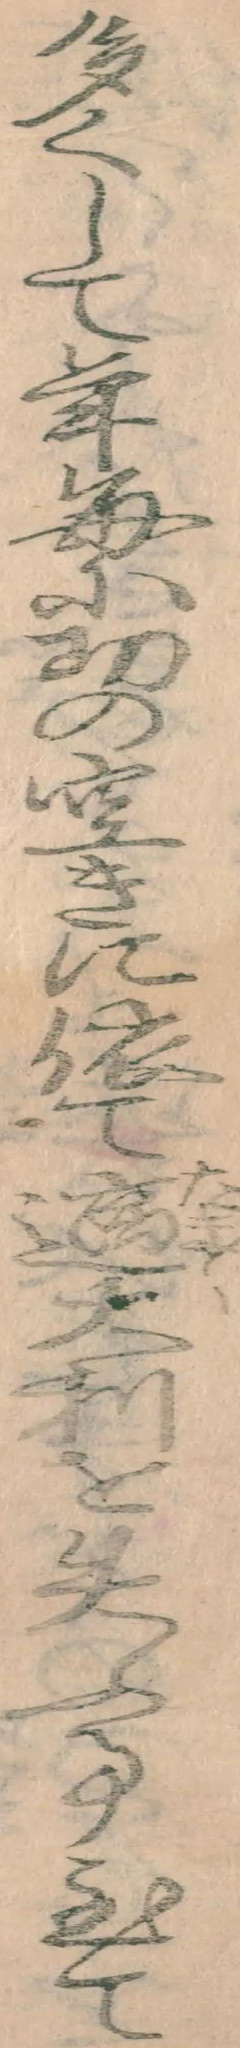多くして年毎に功の空きに依て適大利を失ふ事至て
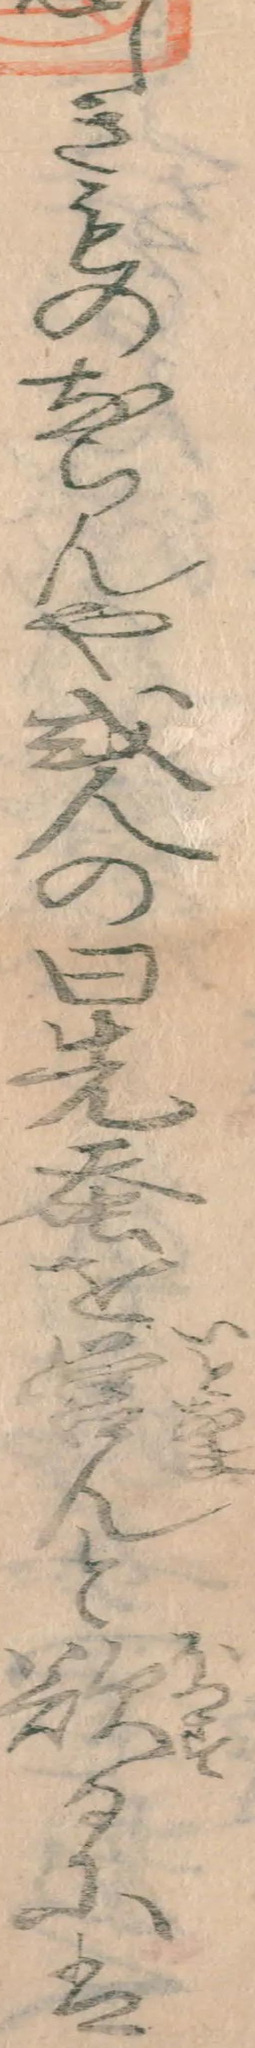悲しきものならんや或人の曰先蚕を営んと欲るには
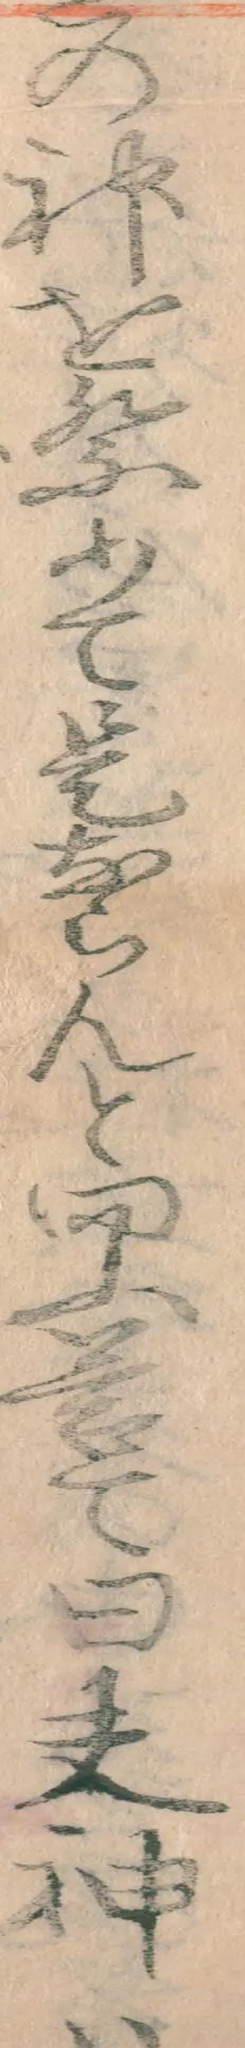何れの神を祭りて是ならんと問ふ答て曰夫神は
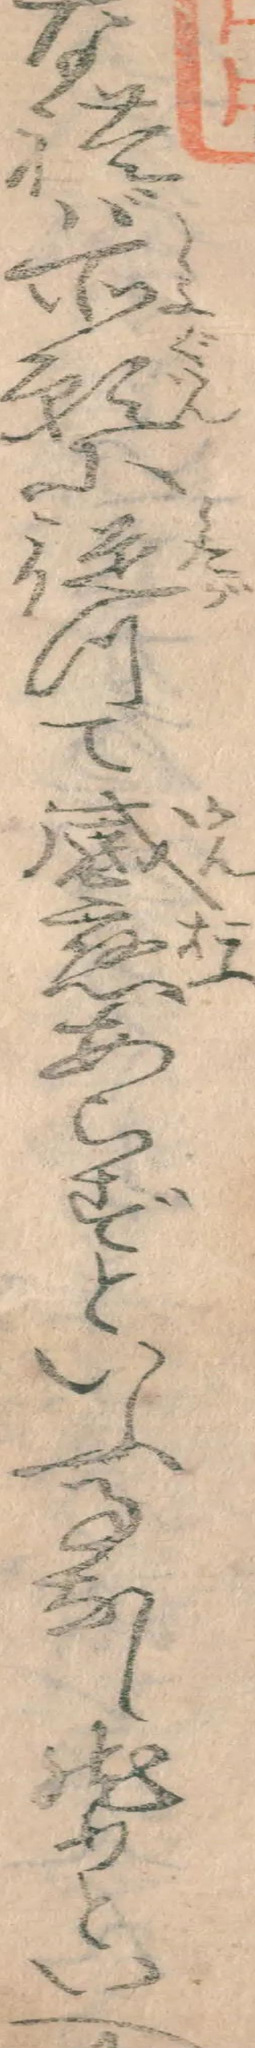なれば所願に従つて感應あらずといふ事なし然りといへ共
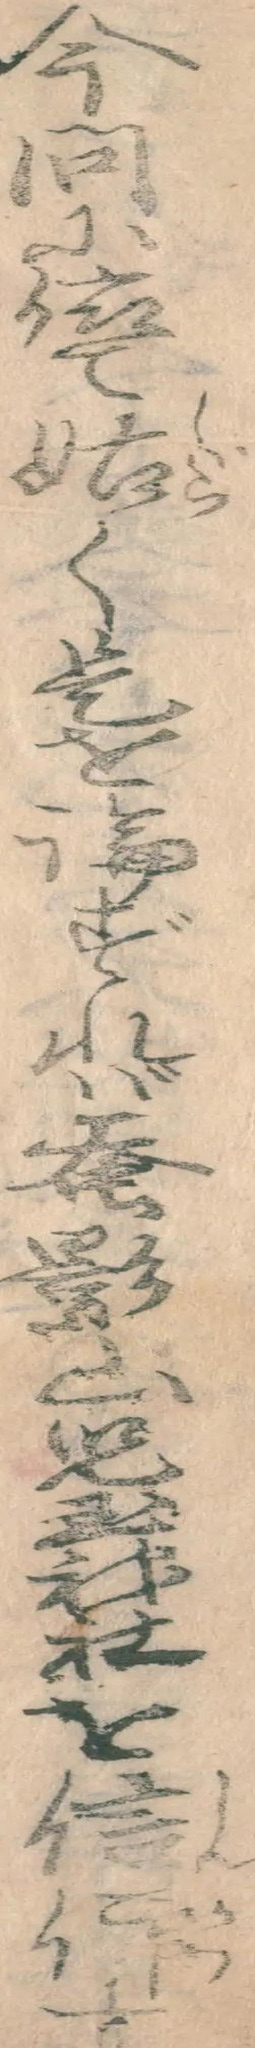今問に依て姑く是を論ずれば蚕影山児玉神社を信仰す
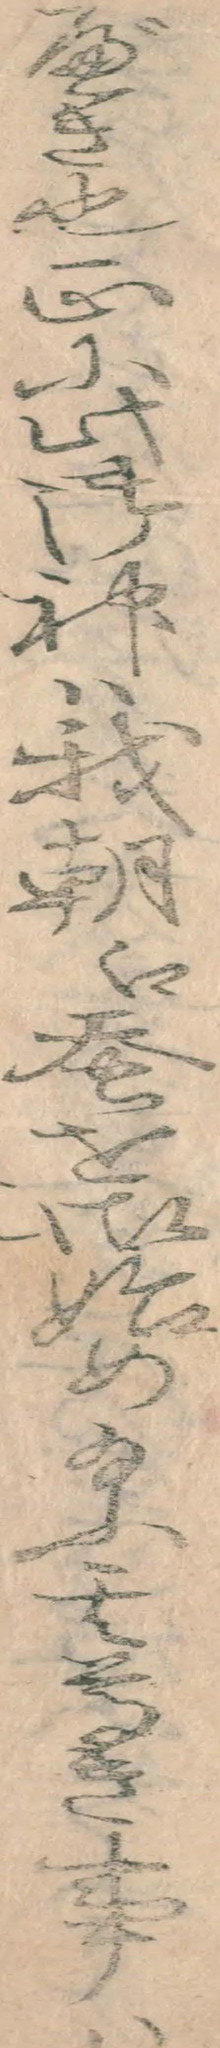べき也正に此御神は我朝え蚕を御始め給ふ其尊き事は
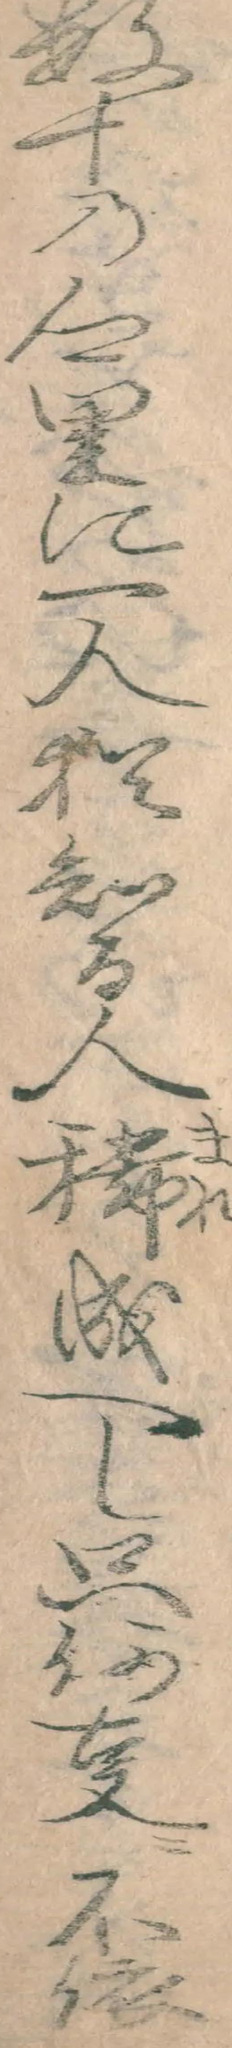数十の郷里に一人猶知る人稀成へし只何事に不依

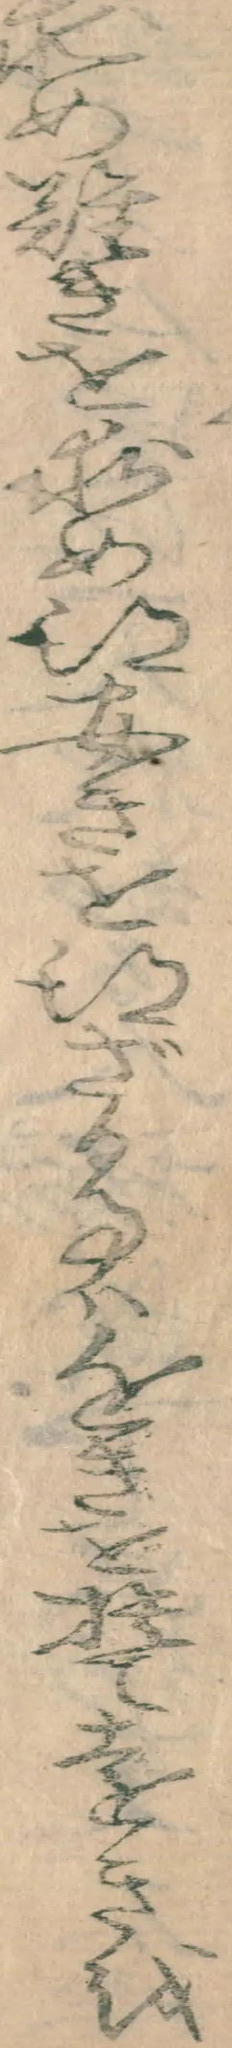求め難きをも求め得安きを得ざる事は近きを捨て遠きを
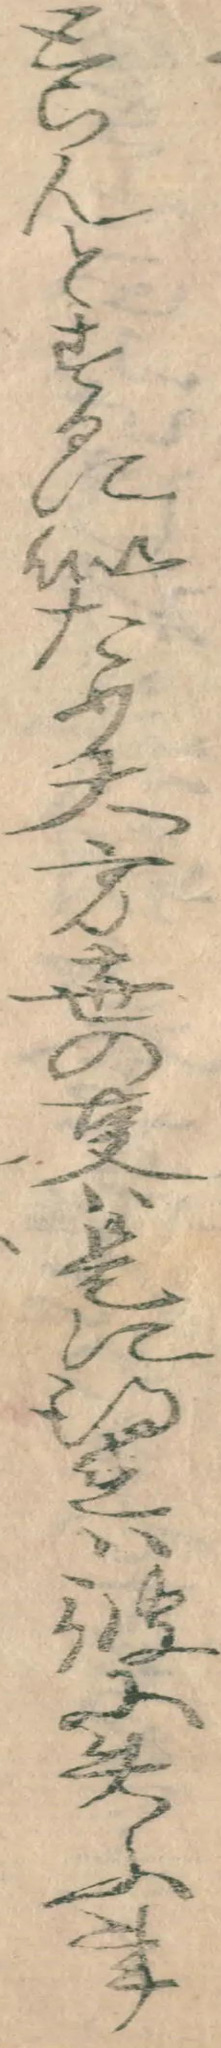とらんとするに似たり大方世の事は是に得れば彼に失ふ事
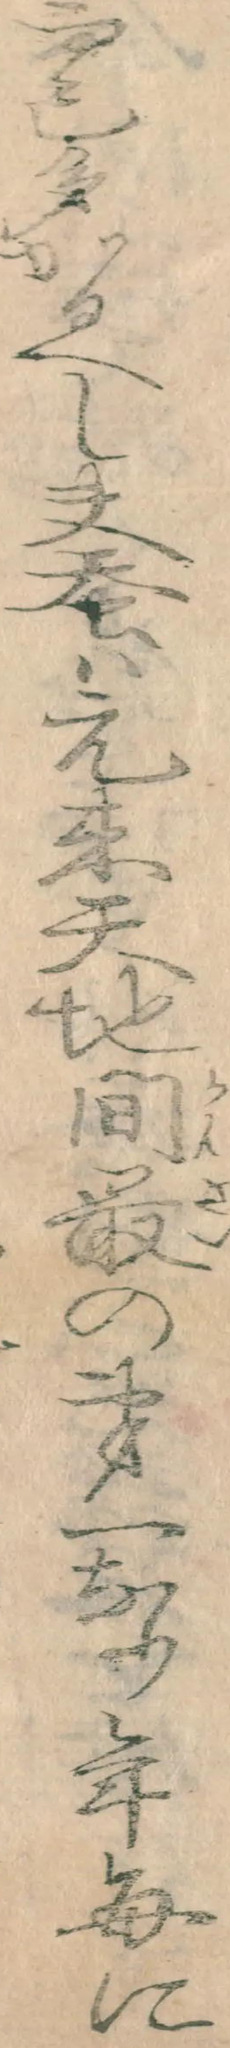而已多かるへし夫蚕は元来天地間最の第一なり年毎に
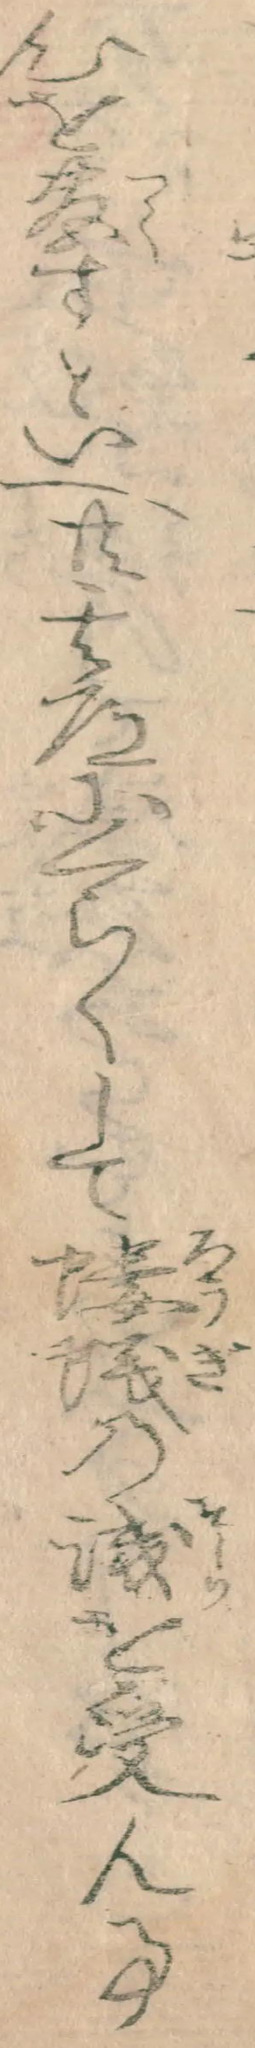心を尽すといへ共其道にくらくして螻蟻の譏を受ん事
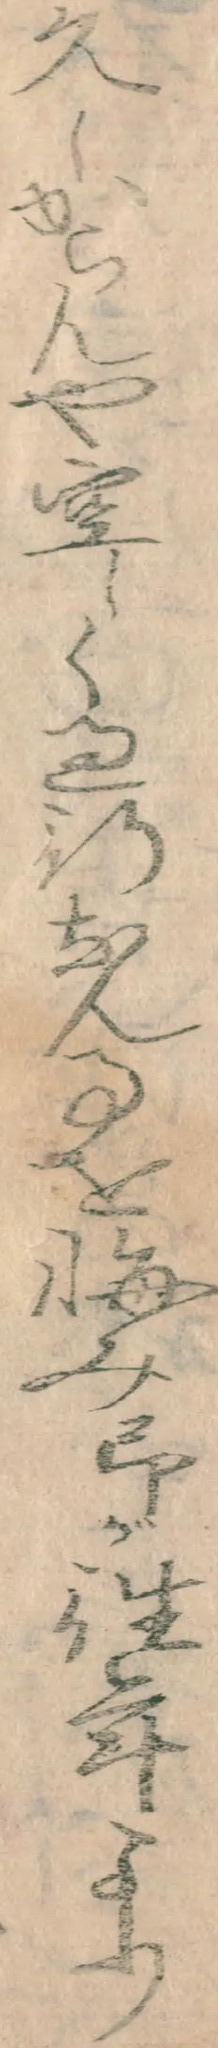久しからんや空しく過行なん事を悔み予が往年より
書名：蚕養御由来記
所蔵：国立国会図書館 National Diet Library, JAPAN
